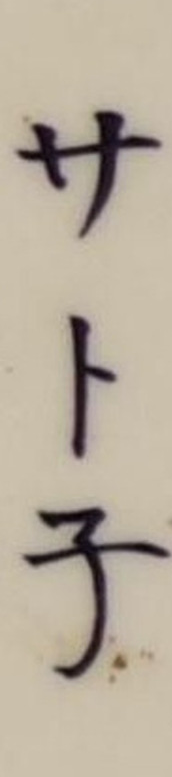サト子
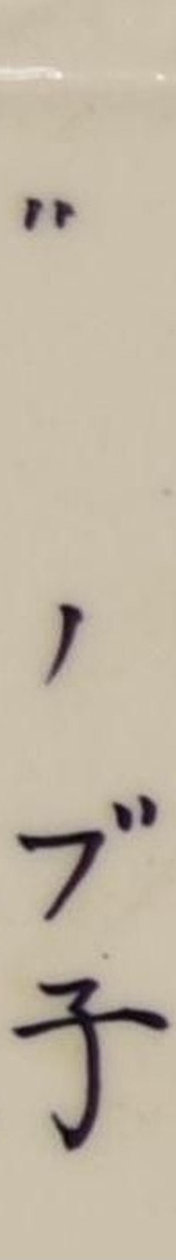ノブ子
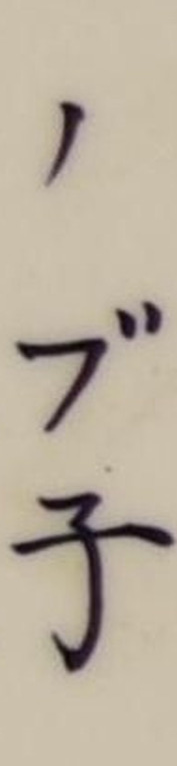ノブ子
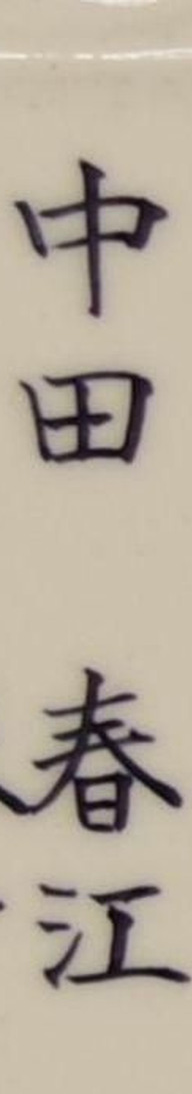中田春江

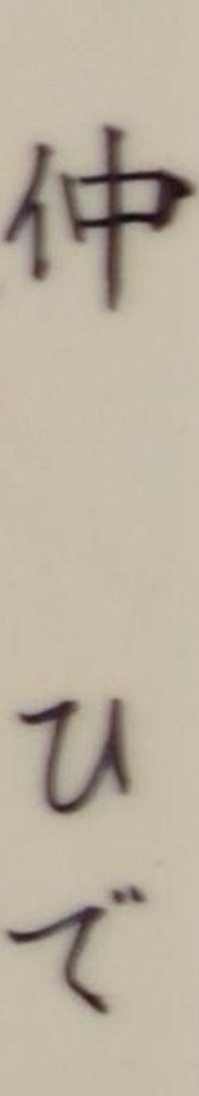仲ひで
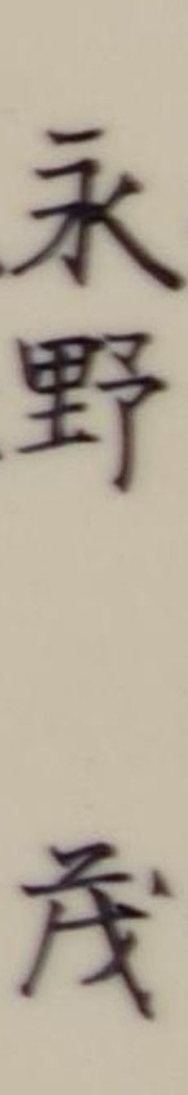永野茂
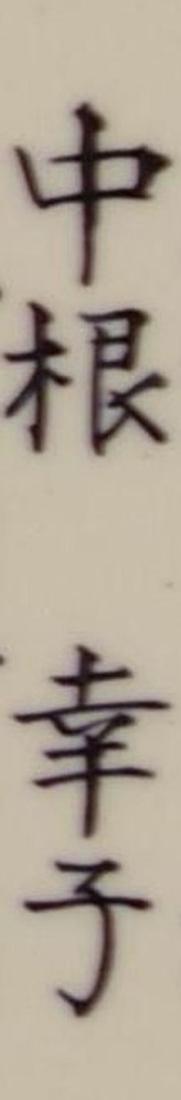中根幸子
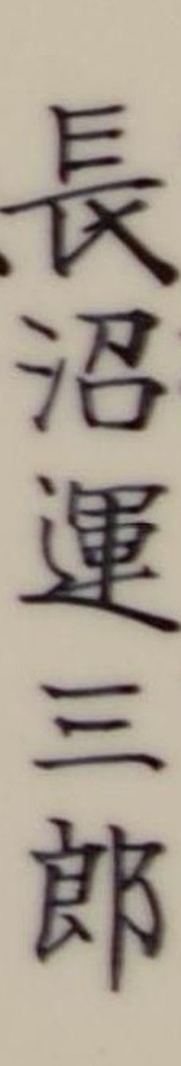長沼運三郎
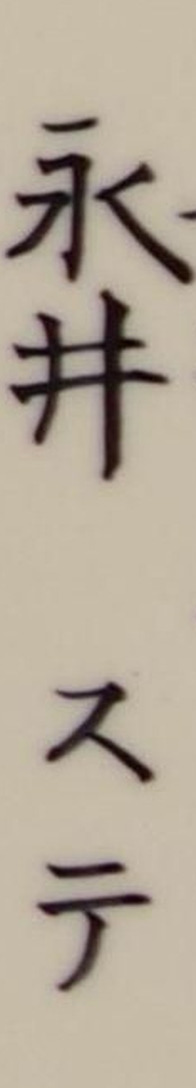永井ステ
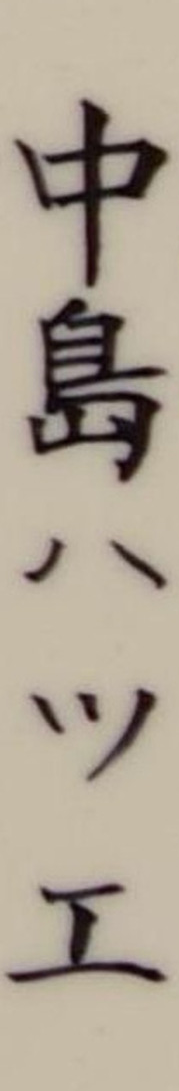中島ハツエ
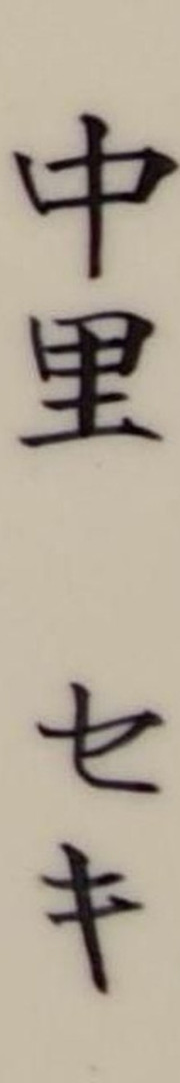中里セキ
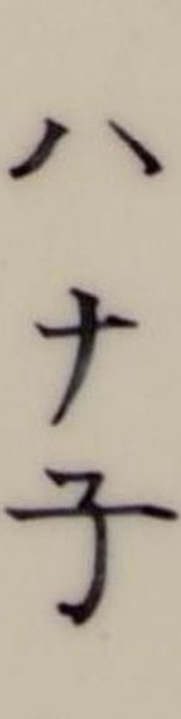ハナ子
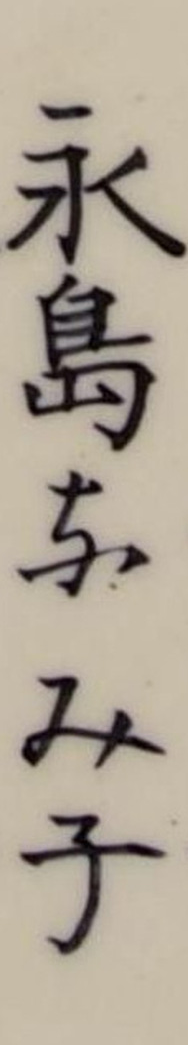永島なみ子
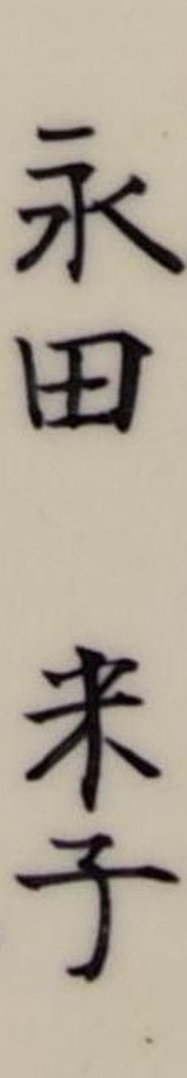永田米子
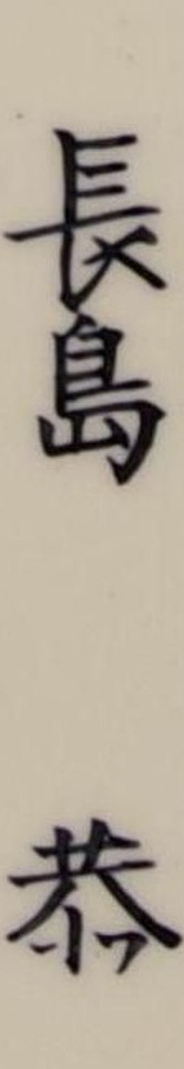長島恭
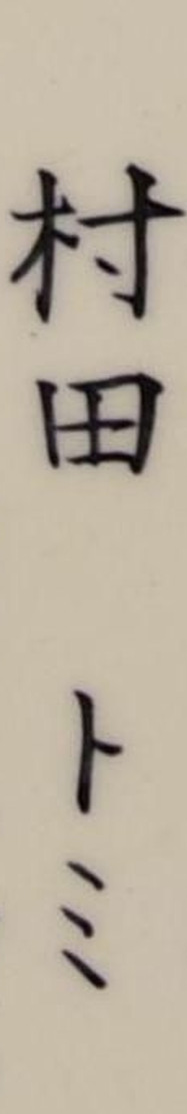村田トミ
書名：M~S
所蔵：高野山金剛峯寺
